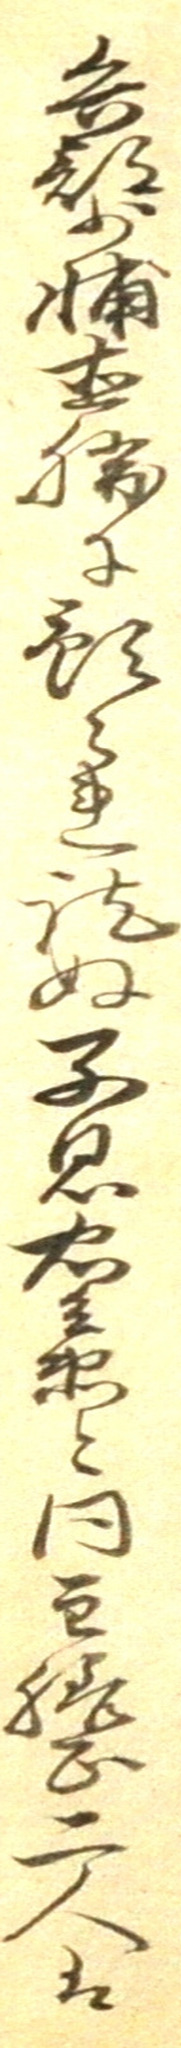兵部少輔直勝に預られ訖ぬ子息忠兵衛と同主膳正二人は
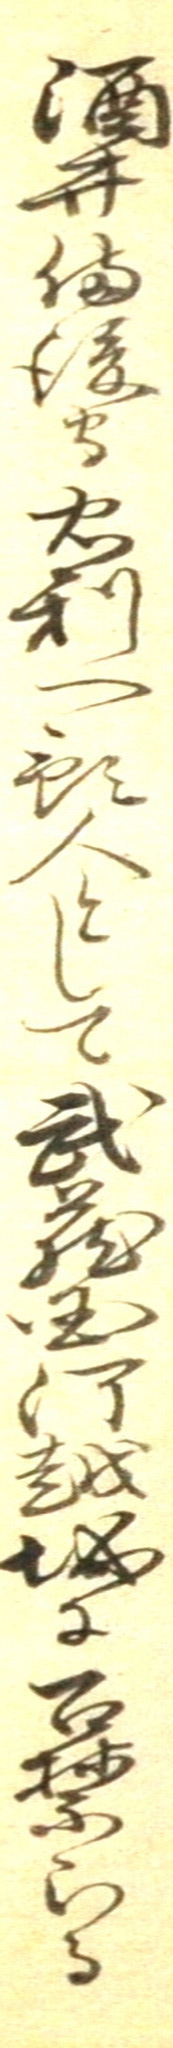酒井備後守忠利預人として武蔵国川越城に召禁らる
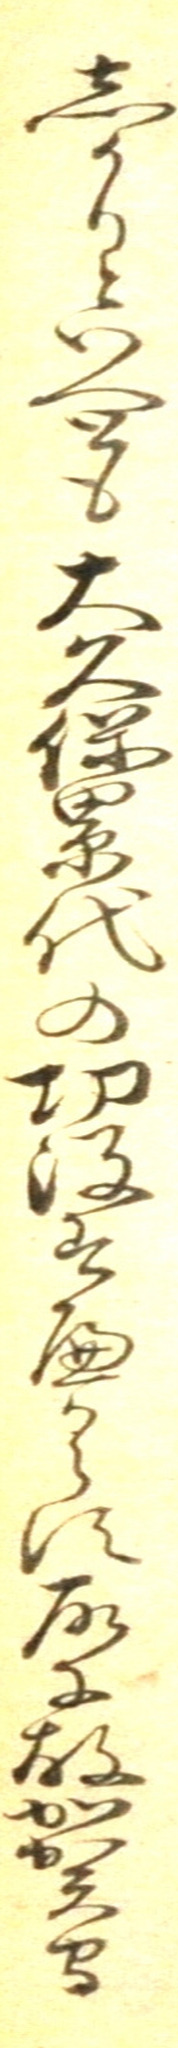しかりといへとも大久保累代の功没すへからす故に故加賀守
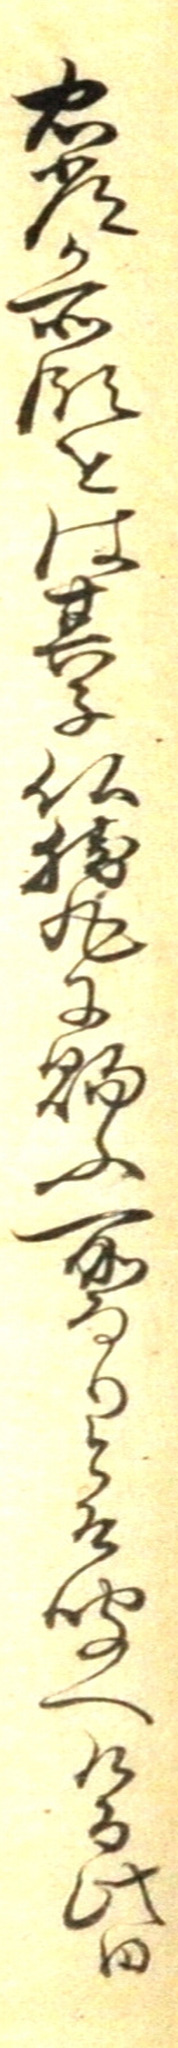忠常か所領をは其子仏勝丸に賜ふ所なりとそ聞へける此日
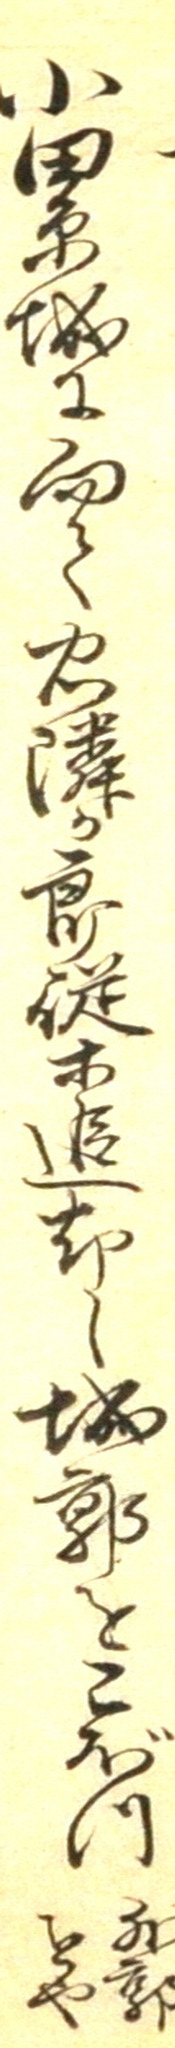小田原城に向て忠隣か郎従等追却し城郭をこぼつ外郭をや
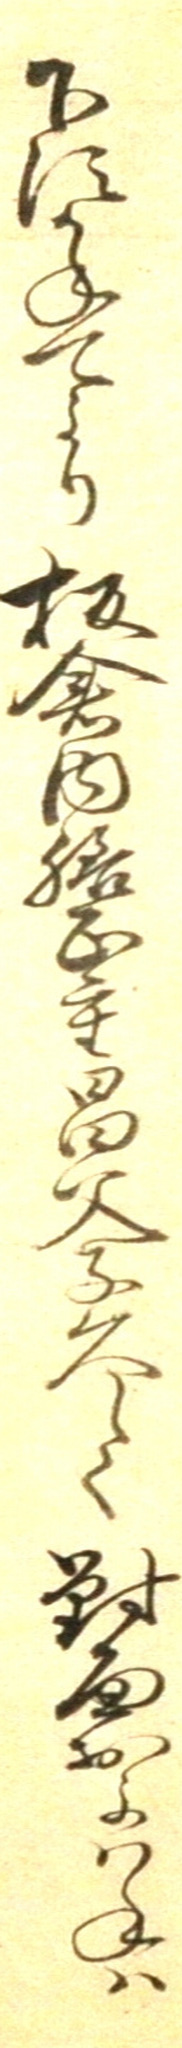下すかねてより板倉内膳正重昌父子久しく対面およはねは
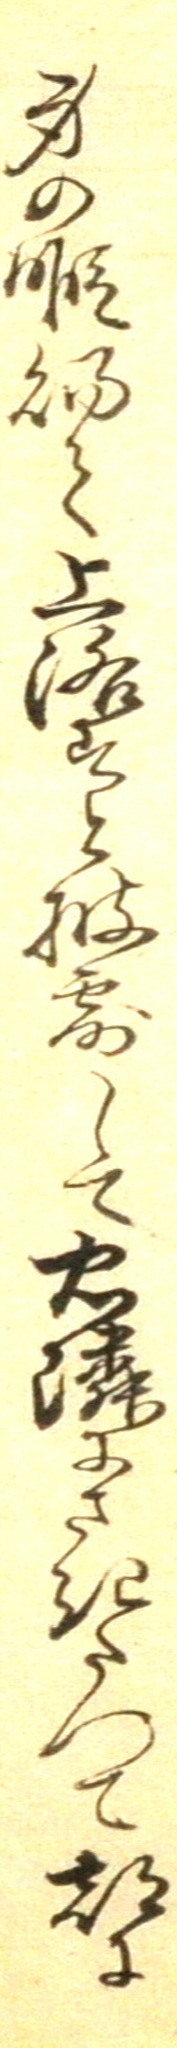身の暇賜て上洛すと披露して忠隣にさきたつて都に
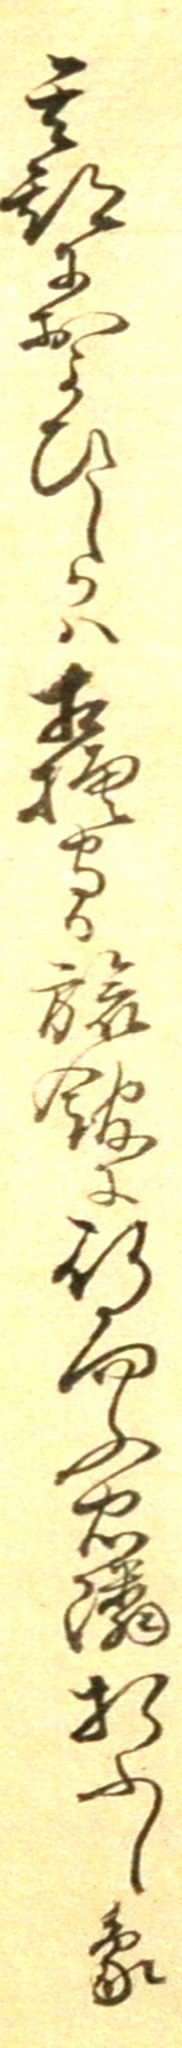其期におよひしかは相模守か旅館に行向ふ忠隣折ふし象
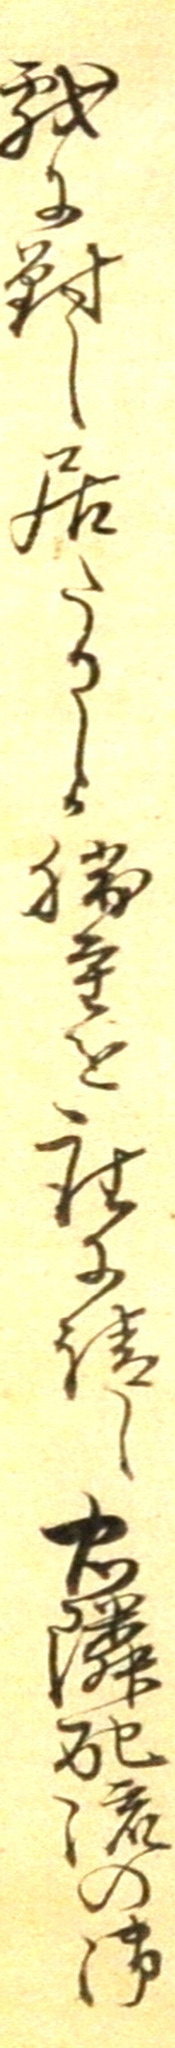戯に対し居たりしか勝重を座に請し忠隣配流の御
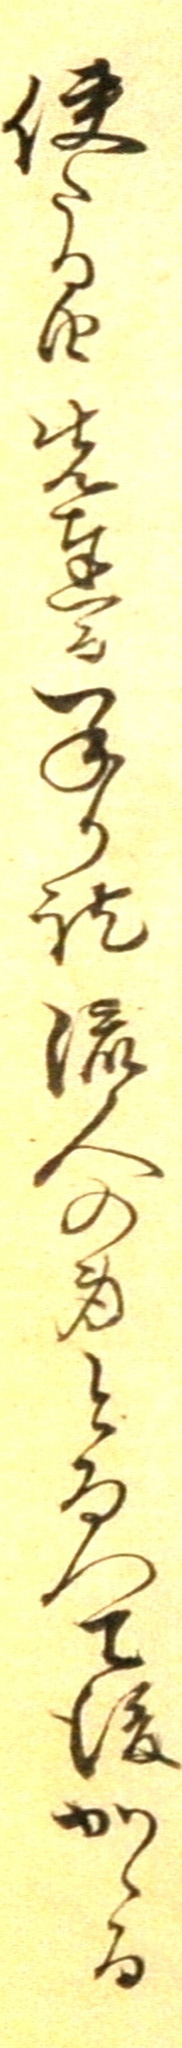使たる由先達而承り訖流人の身となつて後かゝる

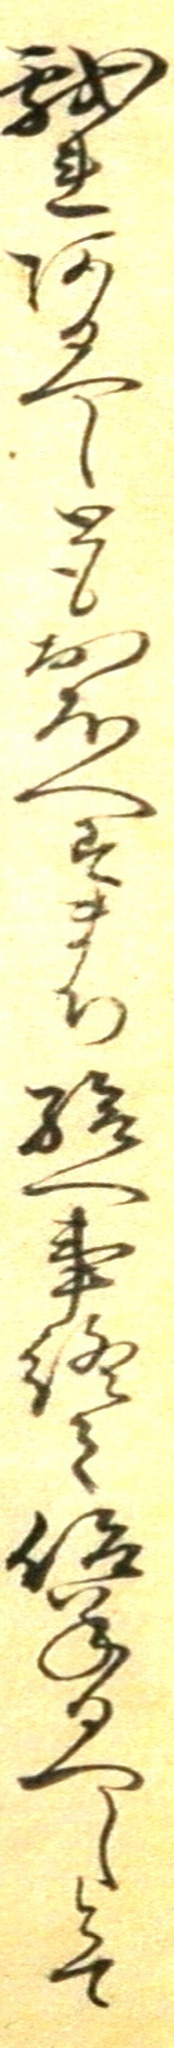戯れあるへしともおほへすまち給へ事終て仰承るへしとて
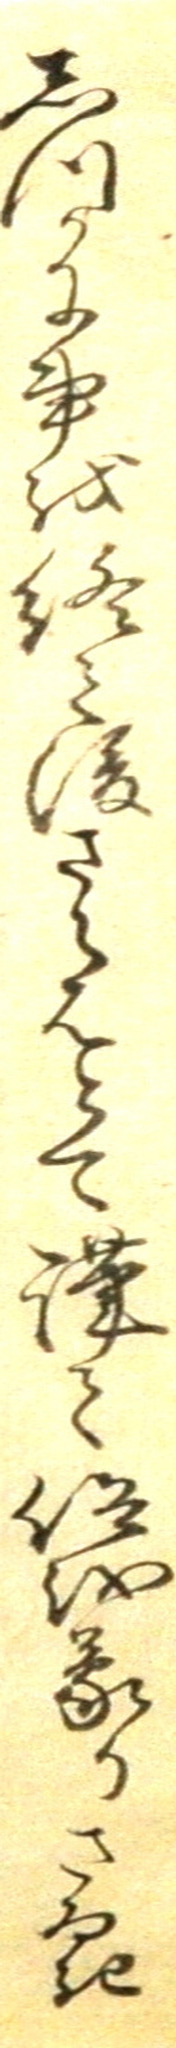しつかに事を終て後さらはとて謹て仰を蒙りさなき
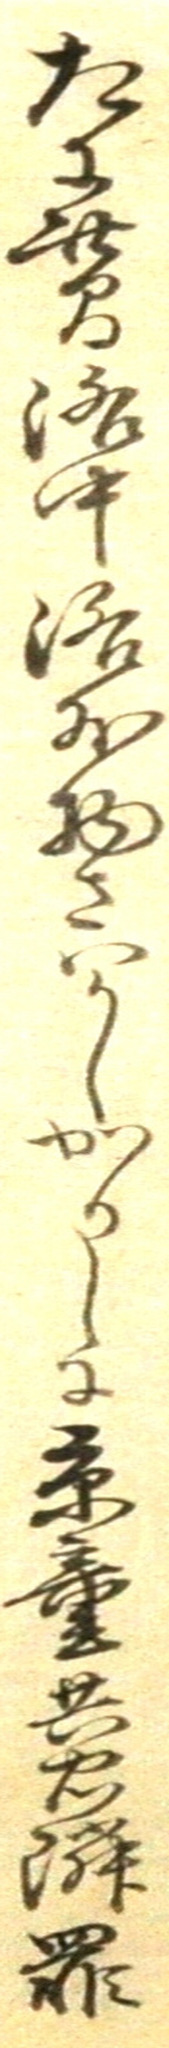たに此間洛中洛外物さはかしかりしに京童共忠隣罪
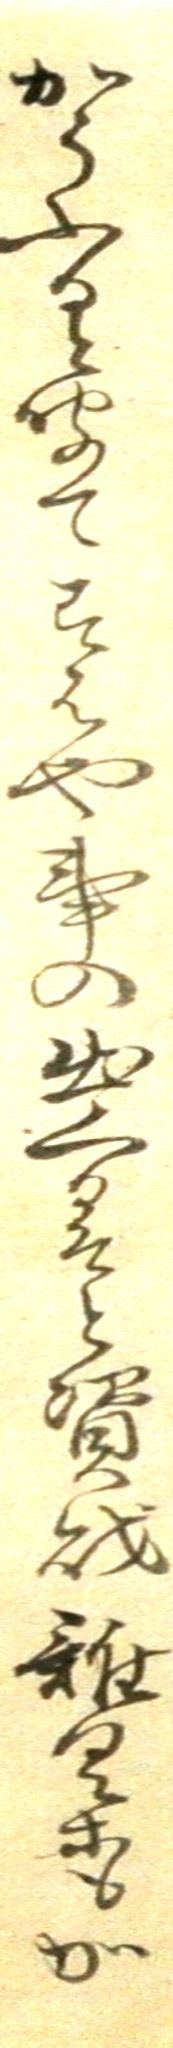かうふると聞てすはや事の出くるそと資財雑具等もか
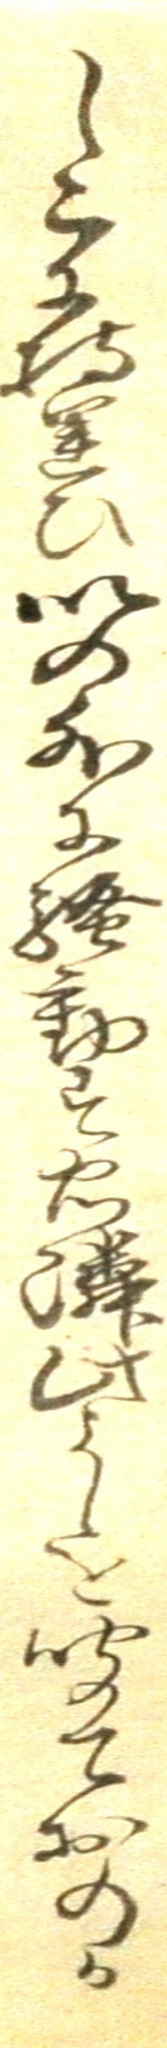しこに持運ひ以の外に騒動す忠隣此よしを聞ておのか
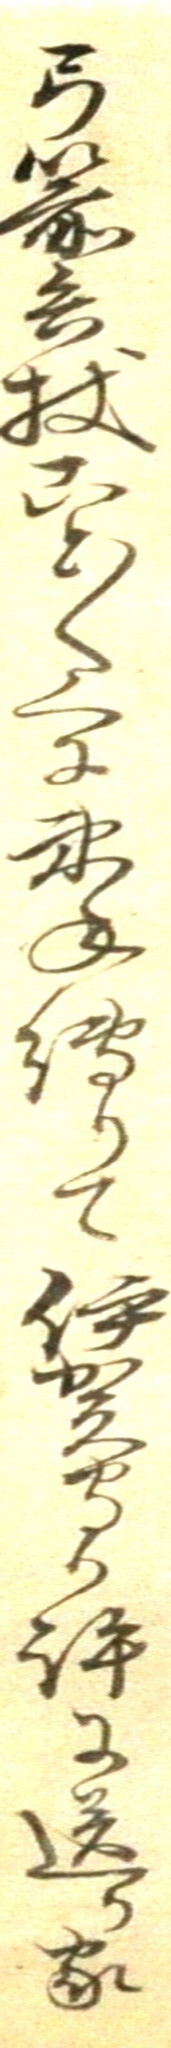弓箭兵杖こと〳〵くに束ね縛りて伊賀守か許に送り家
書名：藩翰譜（四・中）
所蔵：伊那市立高遠町図書館・合同会社AMANE
